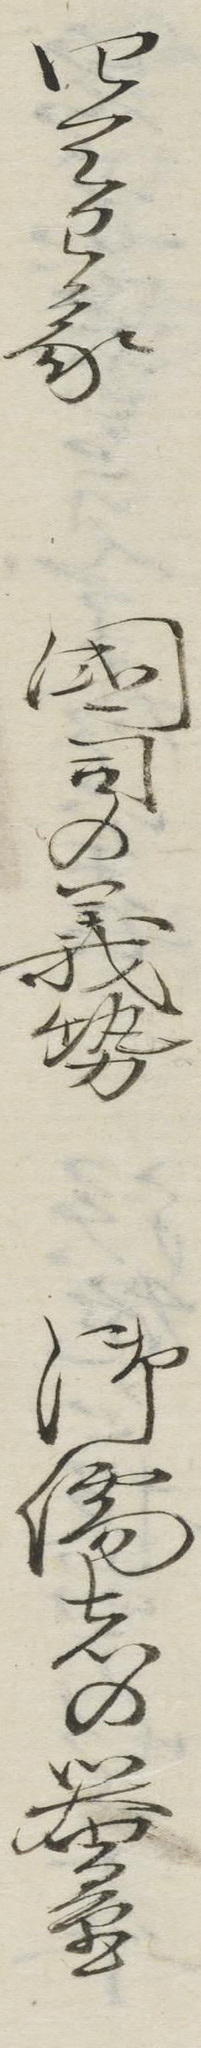四天王寺国司の義勢御儒者の器量
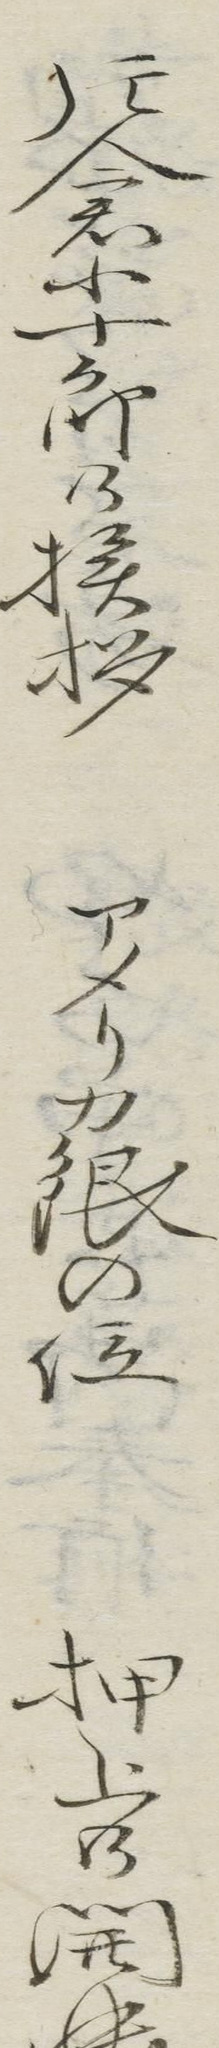片倉小十郎の挨拶アメリカ銀の位押上の開帳
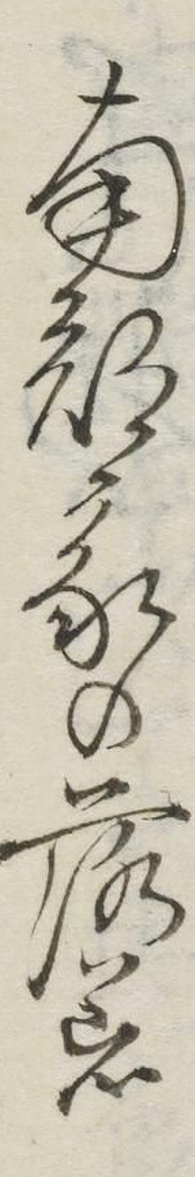南部家の落着
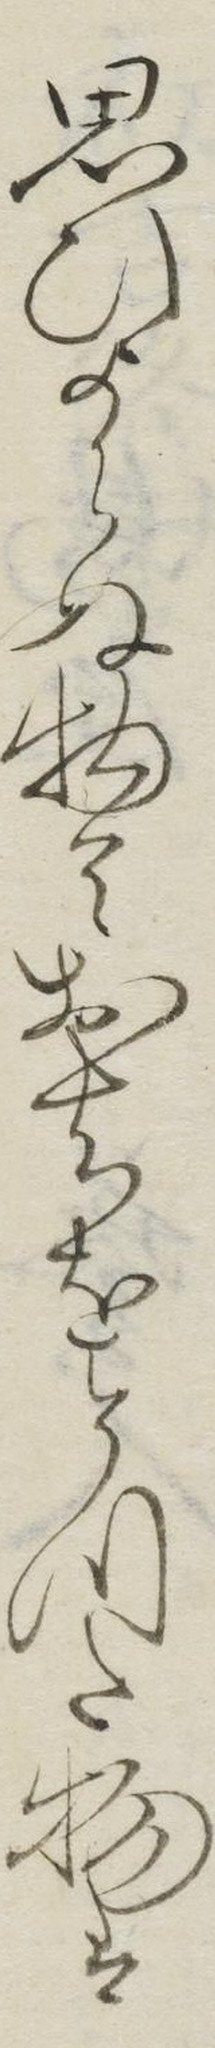思ひよらぬ物ておちをとつた物は
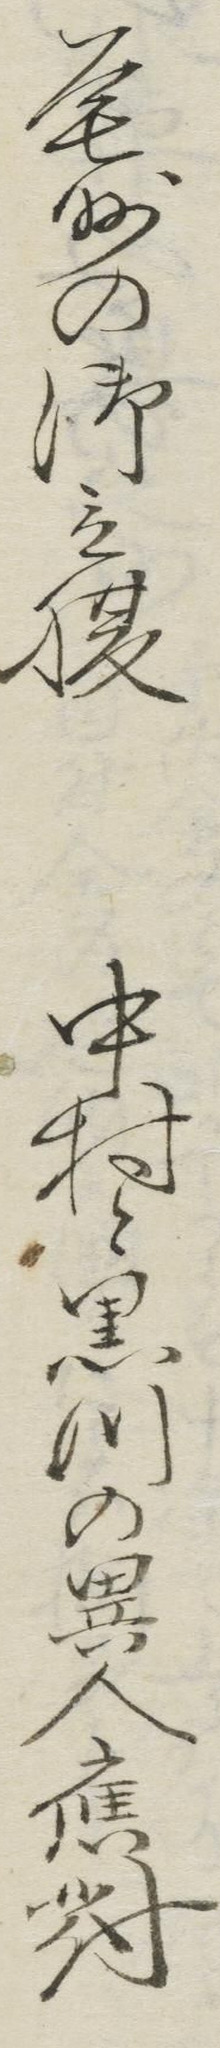尾州の御立腹中村と黒川の異人応対
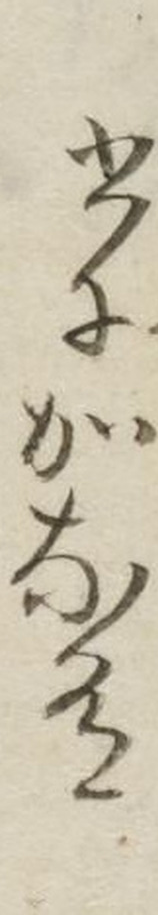書にかな有
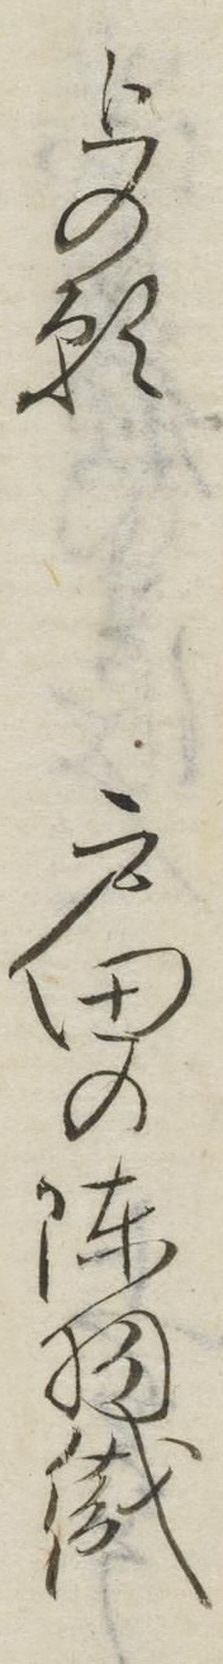上の願戸田の陣羽織
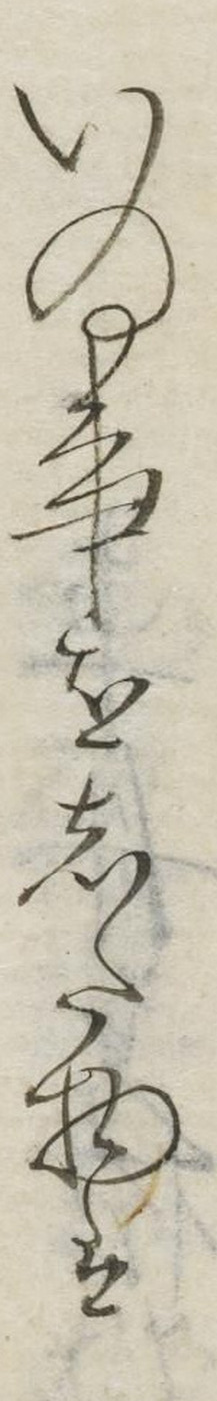いゐ事をした物は
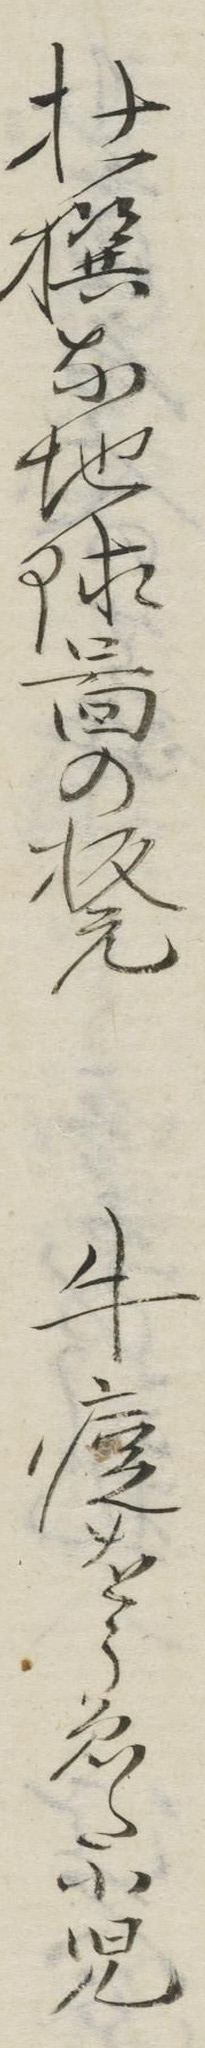杜撰な地球図の板元牛痘をうえた小児
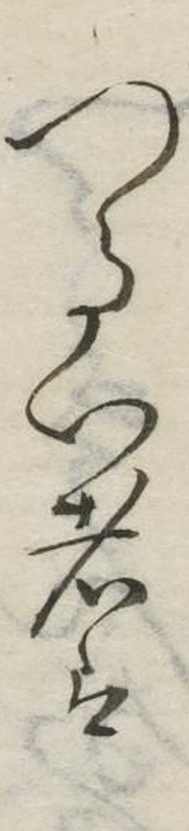つらい者は
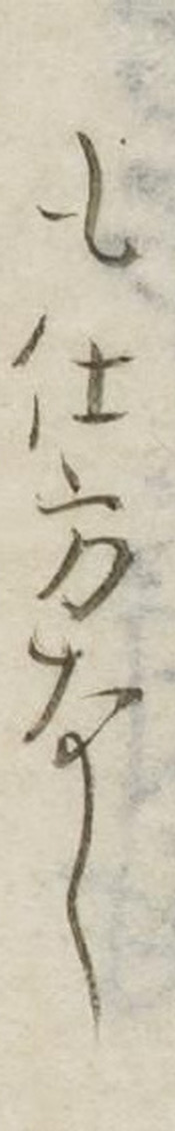も仕方なし
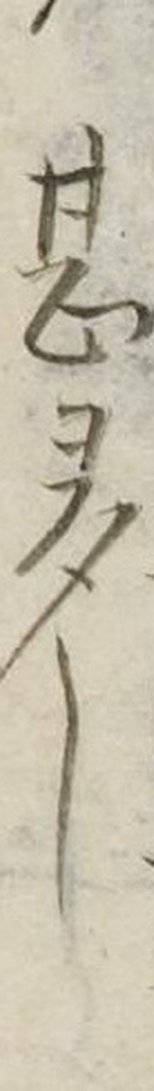甚多し

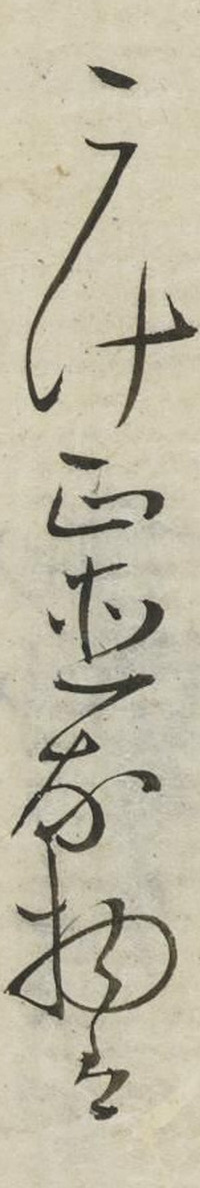こけ正直な物は
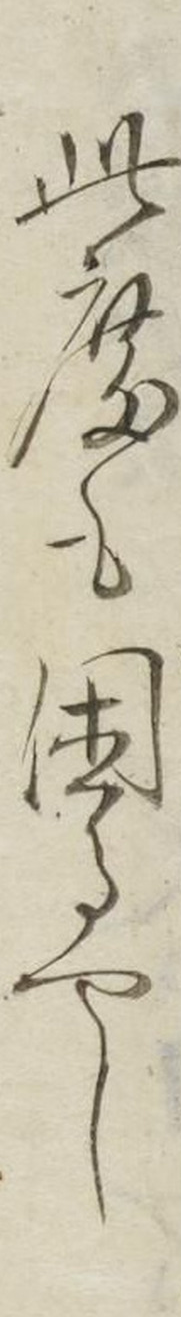此度も困るへし
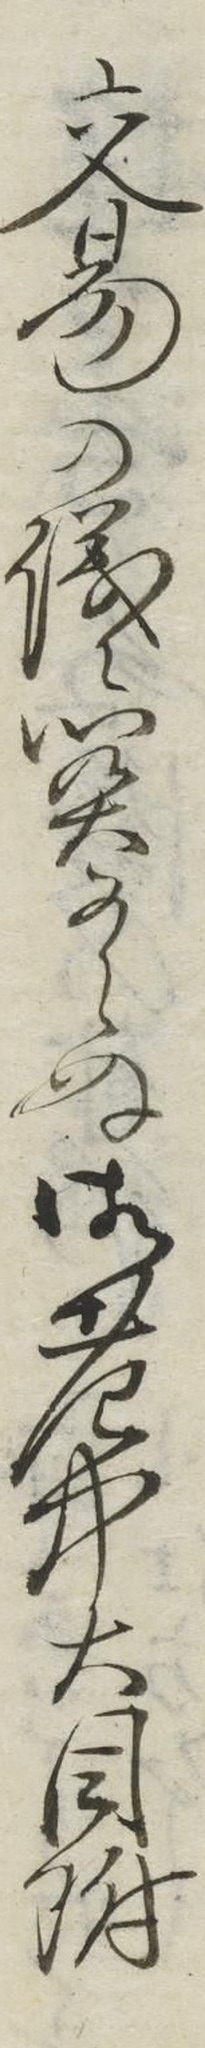交易の儀ニ関有ぬ御老中大目附
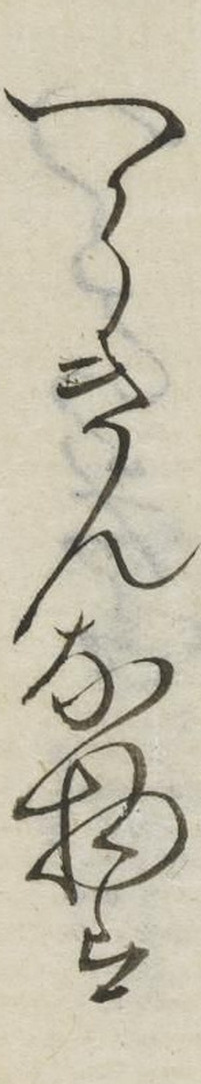へうきんな物は
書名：大地震實録
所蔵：東京大学地震研究所図書室 Earthquake Research Institute Library, The University of Tokyo, JAPAN
